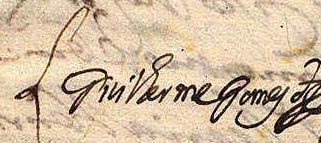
Guilherme Gomes d̄
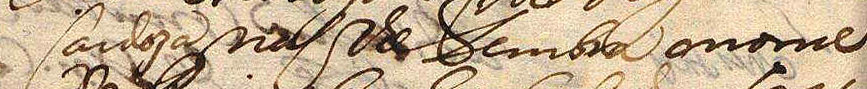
Cardoza nā lhe Lembra o nome
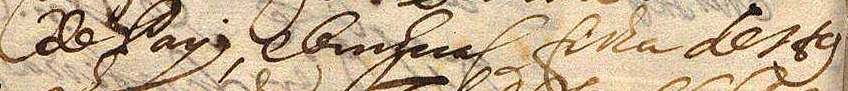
de Pay, e Com huā filha destes
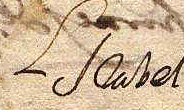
L Izabel
